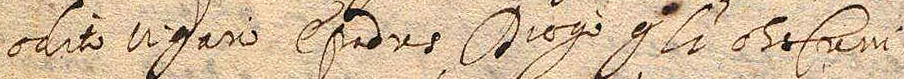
o dito vigario & padres Diogo glz̄ o EsCreui
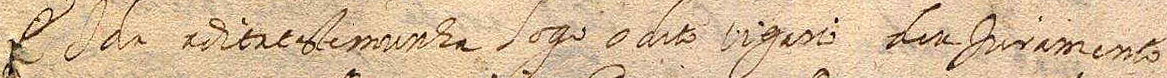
& Ida a dita testemunha logo o dito vigario deu Juramento
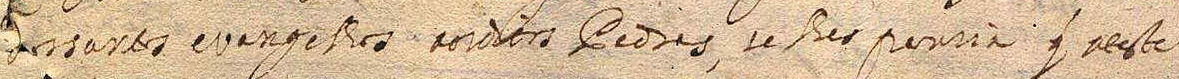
dos santos evangelhos aos ditos Padres, se lhes parecia q̄ a teste
